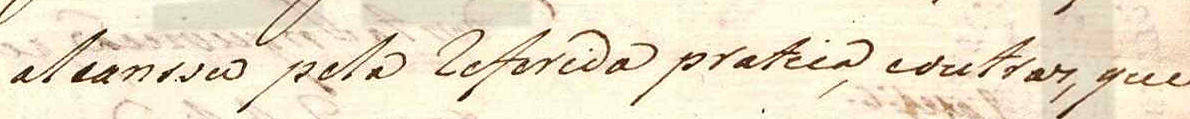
alcansou pela Referida pratica, e outras, que
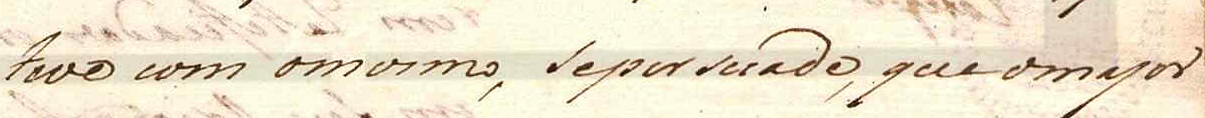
teve com o mesmo, se persuade, que o major
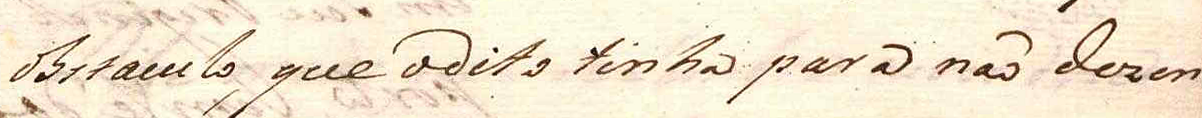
obstaculo, que o dito tinha para não dezen
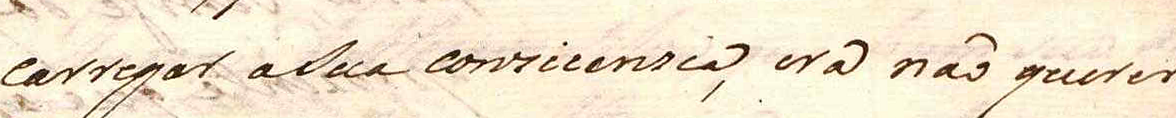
carregar a sua consciencia, era não querer
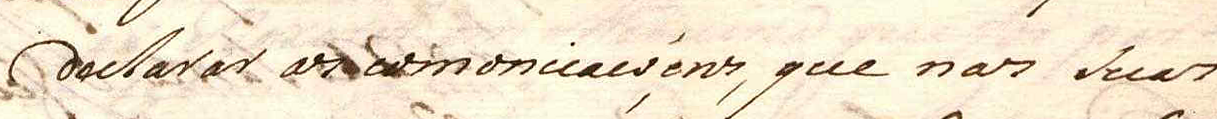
declarar as comonicaçõens, que nas suas
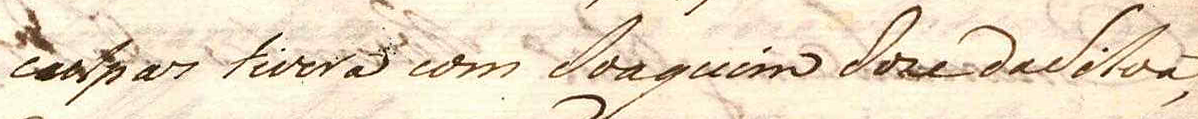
culpas tivera com Ioaquim Ioze da Silva,
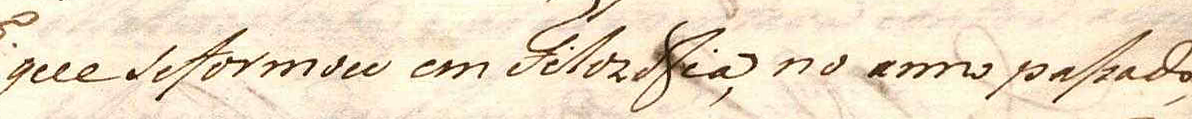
que se formou em Filozofia, no anno passado,
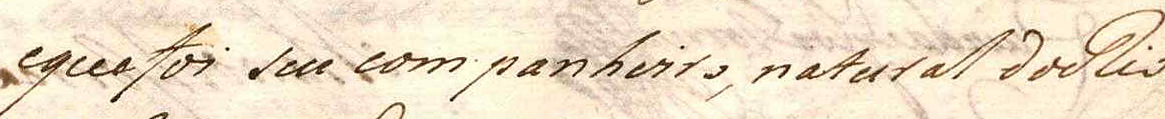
e que foi seu companheiro, natural do Rio
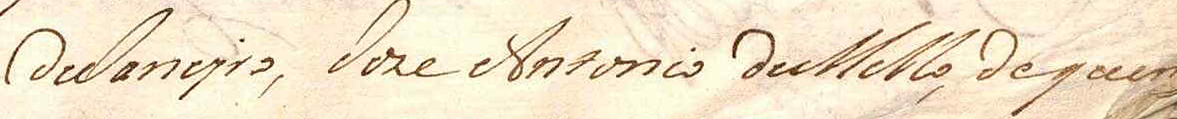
de Ianeiro, Ioze Antonio de Mello de quem
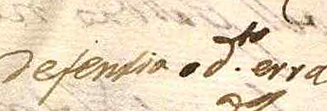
defendia o d.to erro
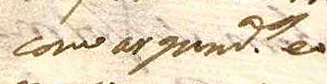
com argum.tos e
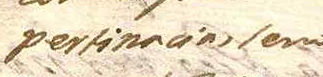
pertinacia sem
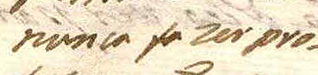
nunca fazer pro
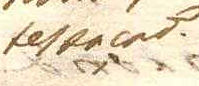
testaçaõ
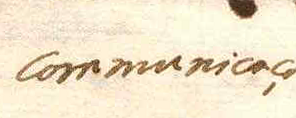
communicaçaõ.
